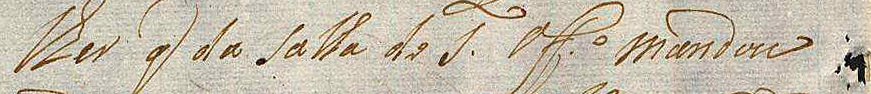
lher q̅ da salla do s.to Off.o mandou
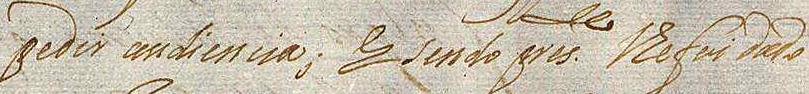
pedir audiencia; E sendo pres.te lhe foi dado
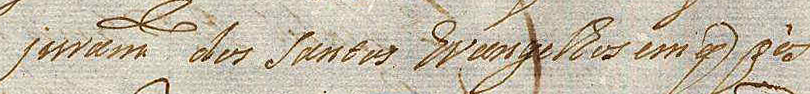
juram.to dos Santos Evangelhos em q̅ pōs
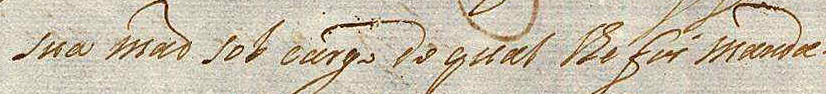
sua mão sob cargo do qual lhe foi manda
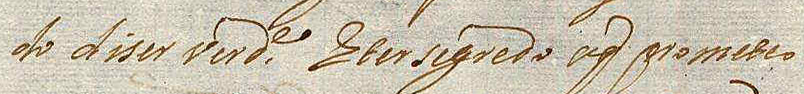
do diser verd.e E ter segredo o q̅ prometeo
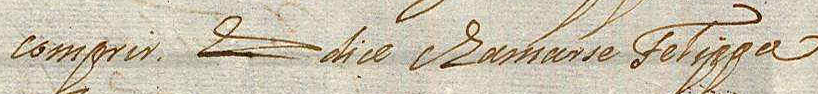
comprir. E dice chamarse Felippa
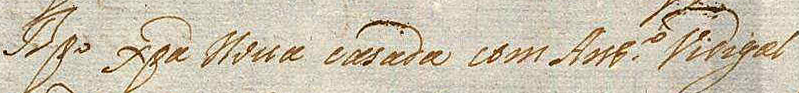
Bpo xpa̅ noua casada com Ant.o Vidigal
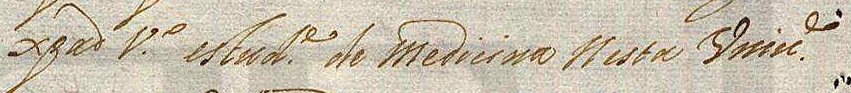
xpão v.o estud.e de medicina nesta Vniu.e
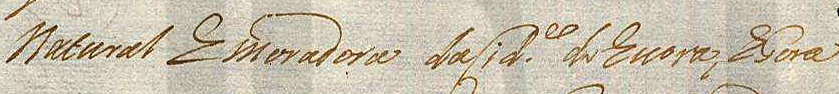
natural E moradora da Cid.e de Euora, E hora
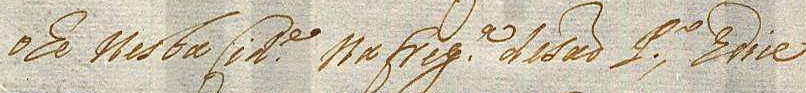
o he nesta Cid.e na freg.a de são P.o E dice
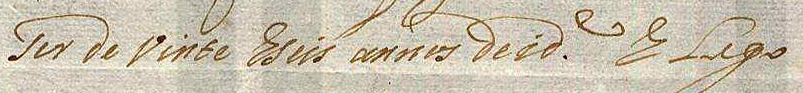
ser de vinte E seis annos de id.e E Logo
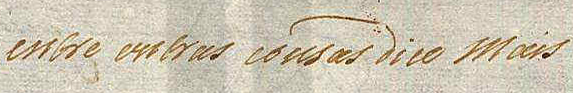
entre outras cousas dice mais
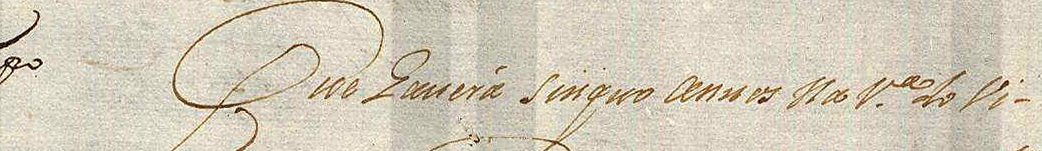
Que hauerá sinquo annos na V.a do Vi
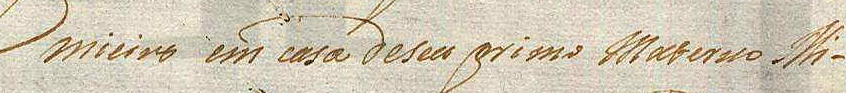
mieiro em casa de seu primo materno Mi
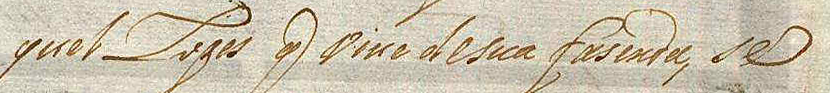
guel Lopes q̅ viue de sua fasenda, se
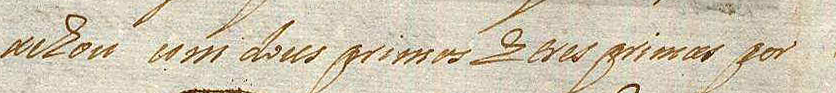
achou com dous primos E tres primas por
